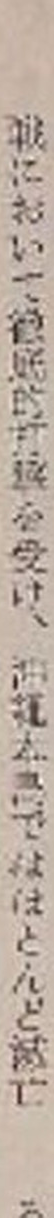戦において徹底的打撃を受け、沖縄本島ではほとんど滅亡
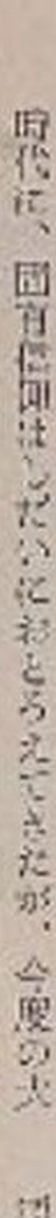時代に、固有信仰はしだいにおとろえてきたが、今度の大
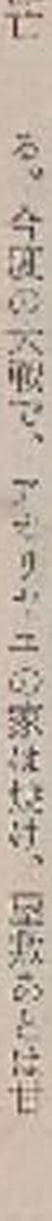る。今度の大戦で、アオリヤエの家は焼け、屋敷あとは甘
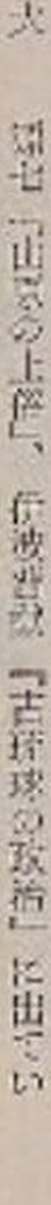源七『山原の土俗』、伊波普猷『古琉球の政治』に出てい
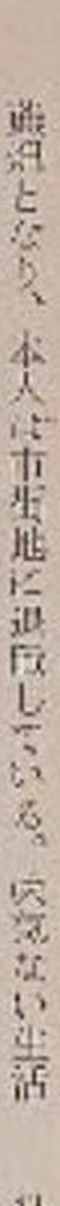藷畑となり、本人は市街地に退散している。味気ない生活
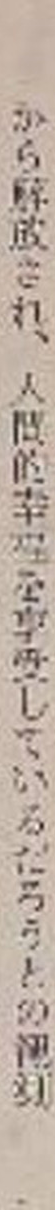から解放され、人間的幸福を享受しているだろうとの観測
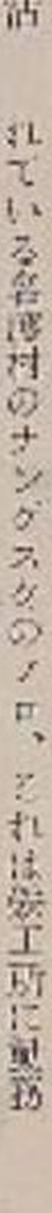れている名護村のナングスクのノロ、これは鉄工所に勤務
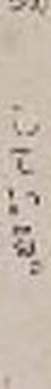している。
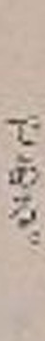である。
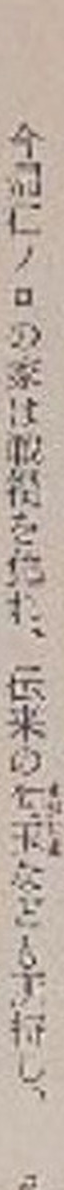今帰仁ノロの家は戦禍を免れ、伝来の勾玉なども所持し、
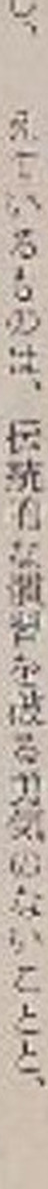えているものは、伝統的な慣習を破る勇気のないことと、
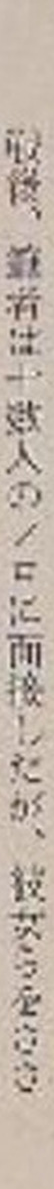戦後、筆者は十数人のノロに面接したが、彼女らをささ
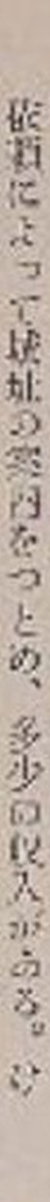依頼によって城址の案内をつとめ、多少の収入がある。け
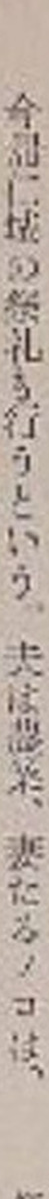今帰仁城の祭礼も行うという。夫は農業、妻たるノロは、
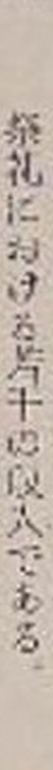祭礼における若干の収入である。
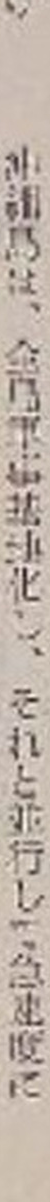沖縄島は、全島軍事基地化し、それと並行して急速度に
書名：沖縄固有信仰のおとろえ
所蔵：University of the Ryukyus Library
